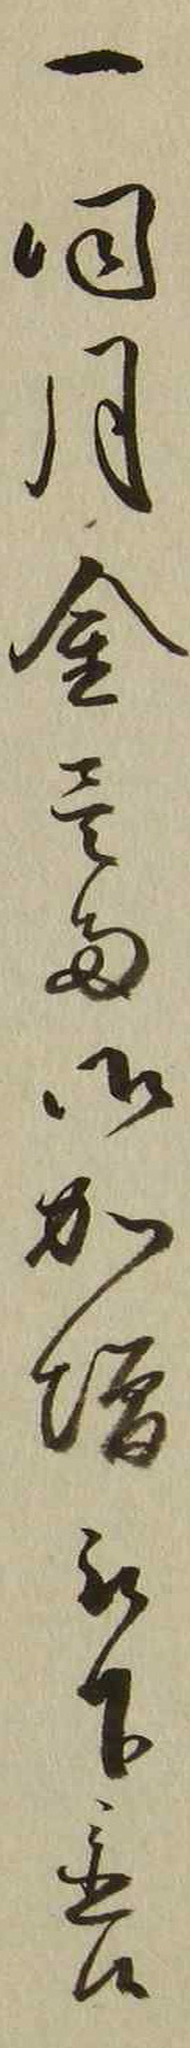一同月金壱両御加増被下置候
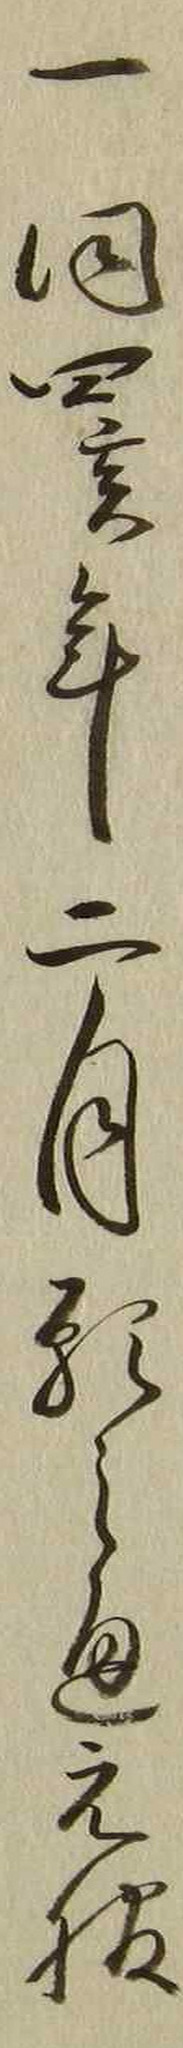一同四亥年二月願之通元服
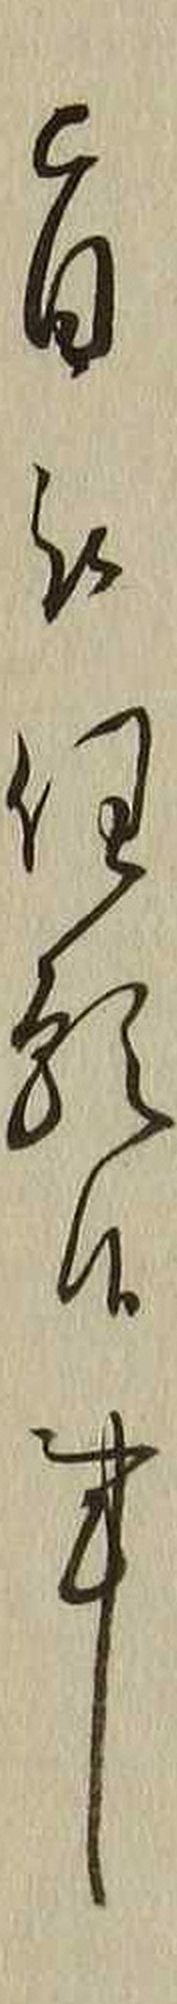旨被任願候事
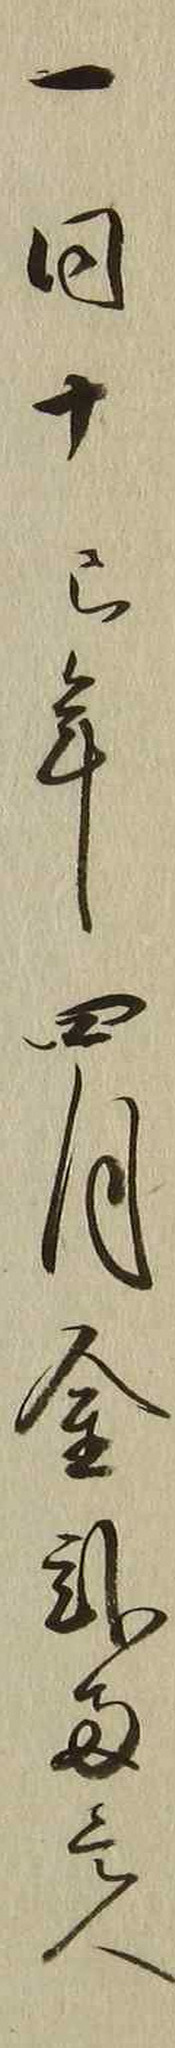一同十巳年四月金弐両壱人
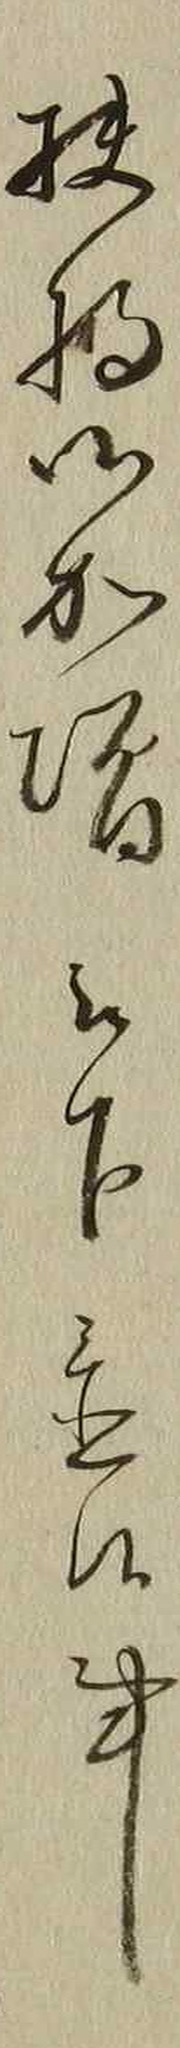扶持御加増被下置候事
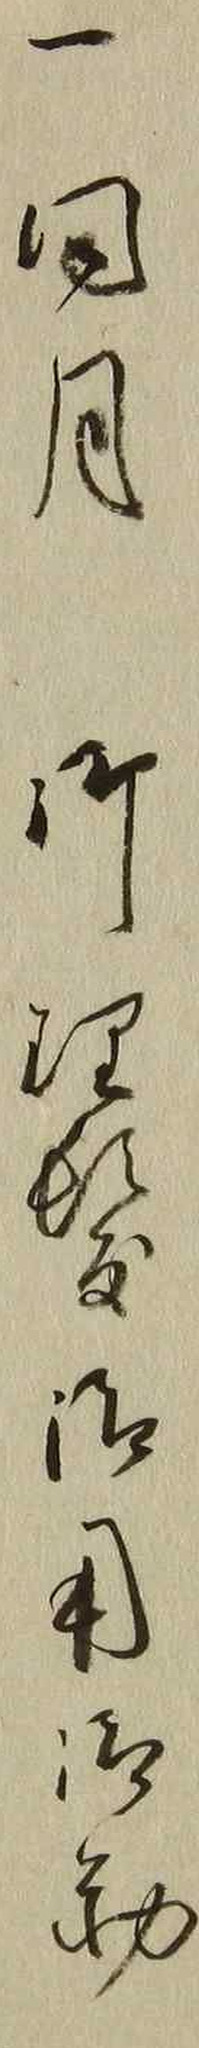一同月御理髪御用御勤
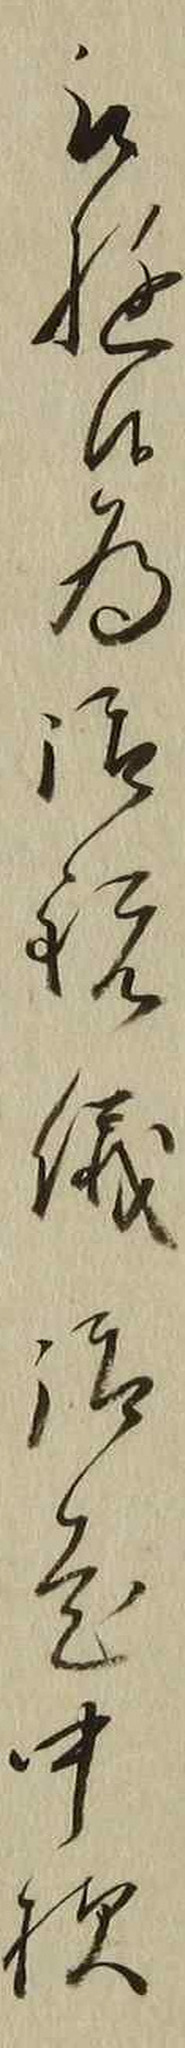被遊候為御祝儀御老中様
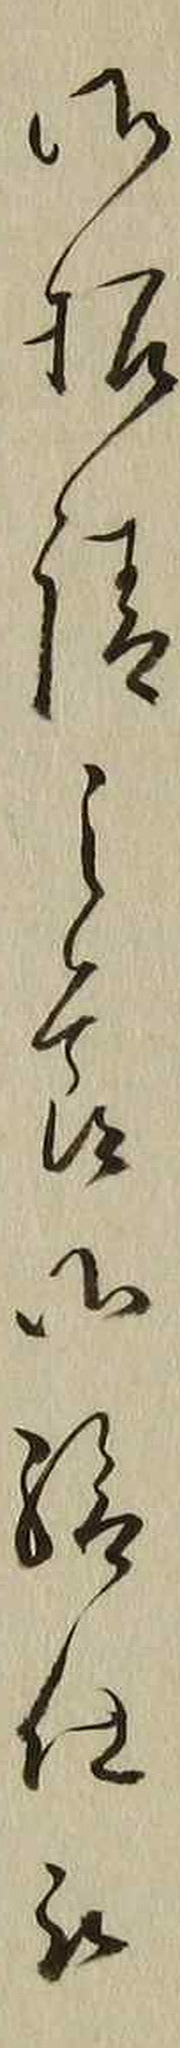御招請之節御給仕被
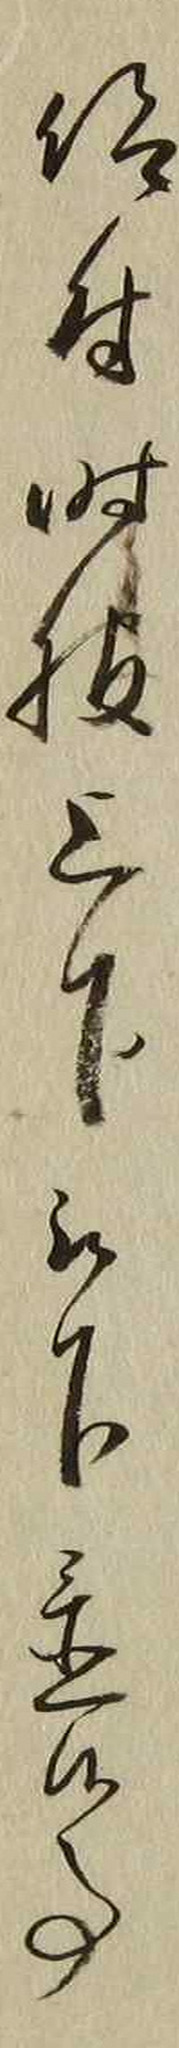仰付時服上下被下置候事
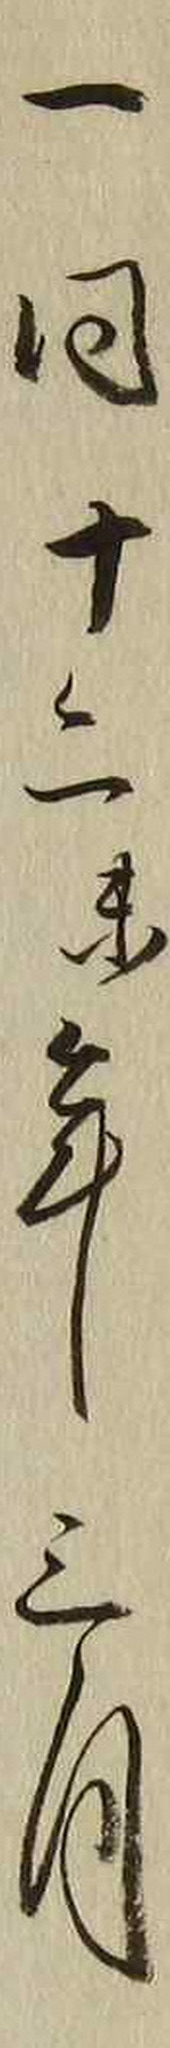一同十二未年三月
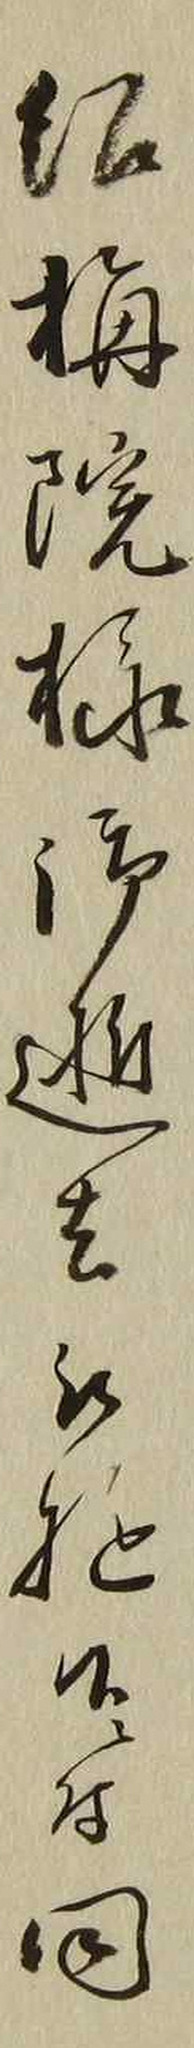紹栴院様御逝去被遊候ニ付同
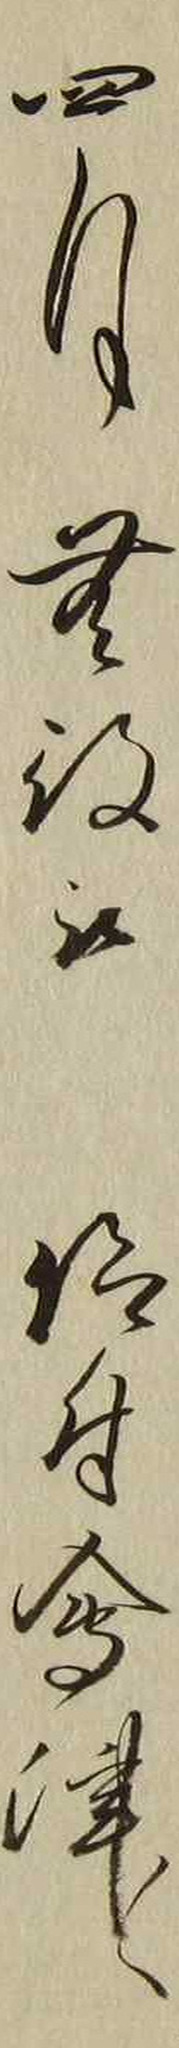四月無役被仰付会津へ
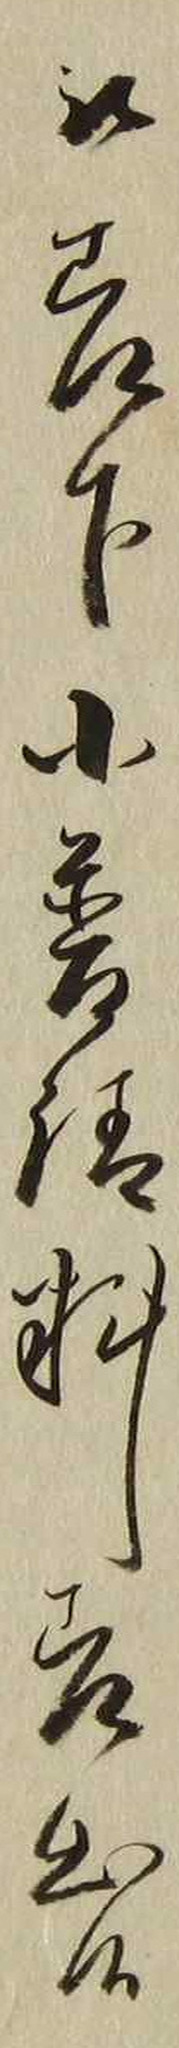被差下小普請料差出候
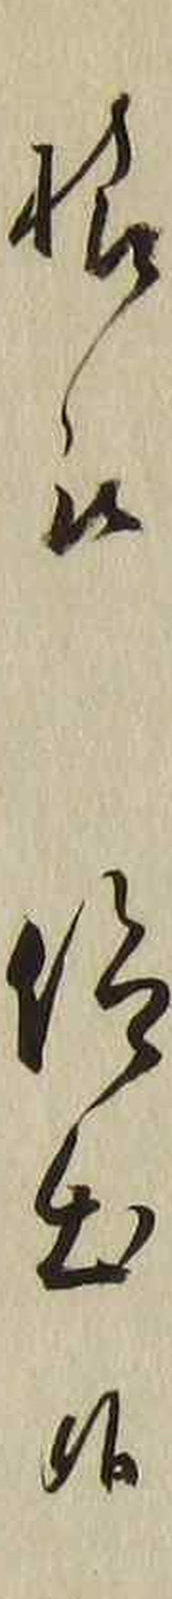様被仰出候
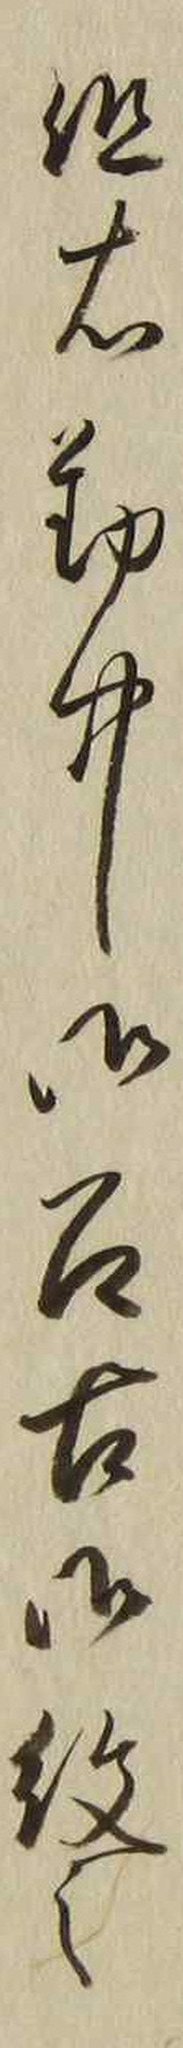但右勤中御召古御紋之
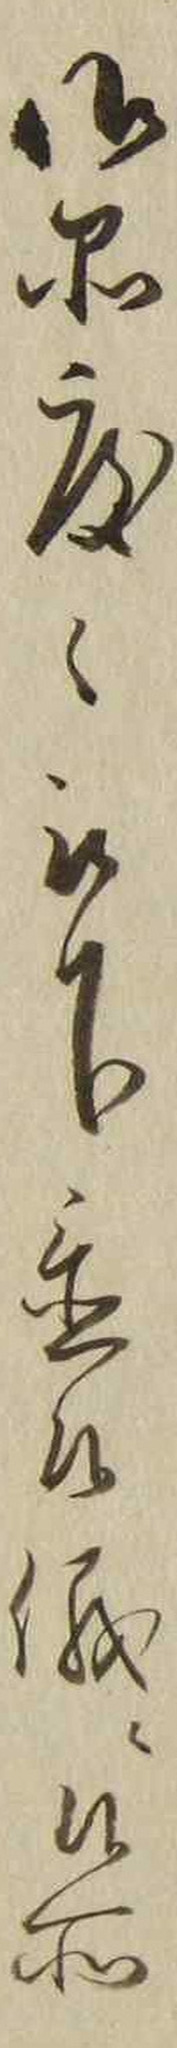御品度々被下置候儀ニ候所
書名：諸士系譜　巻之70　を之部4
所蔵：会津若松市立会津図書館
